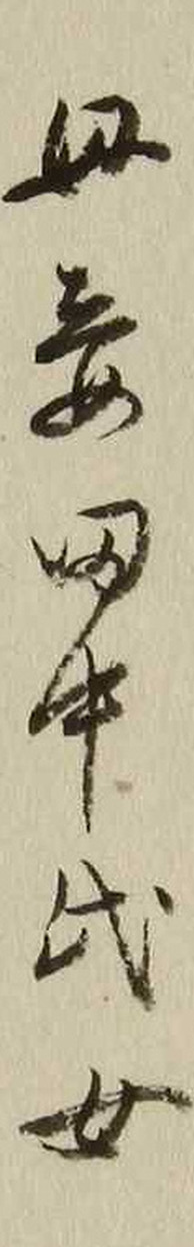母妾田中氏女
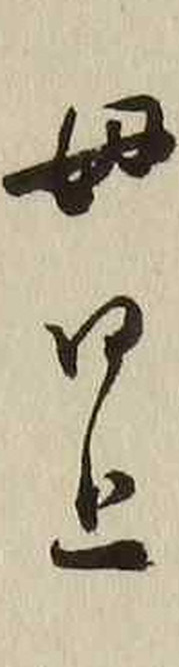母同上
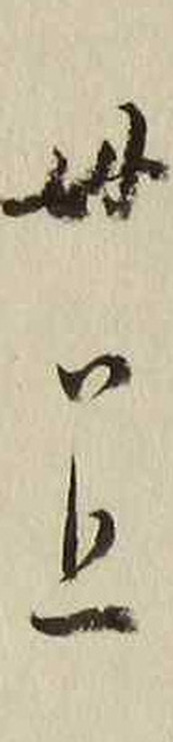母同上

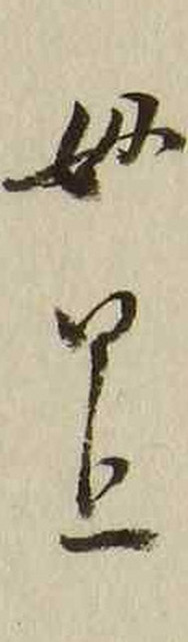母同上
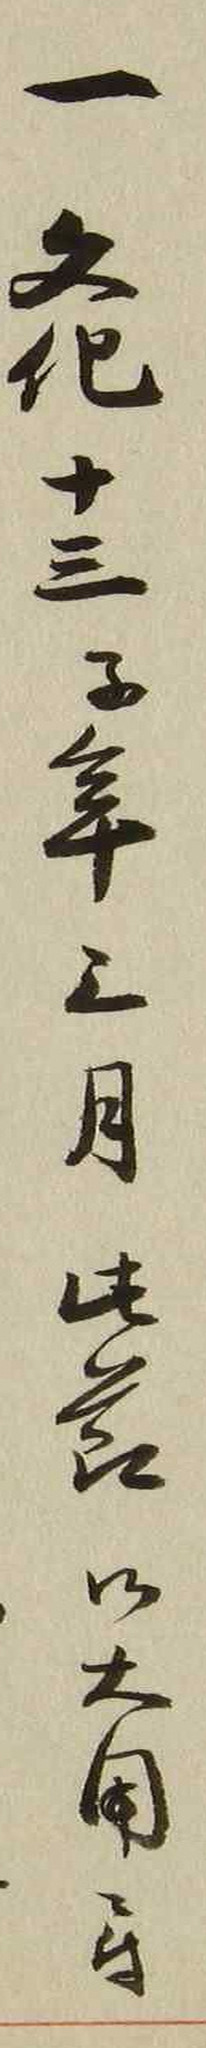一文化十三子年三月此節御大用ニ付
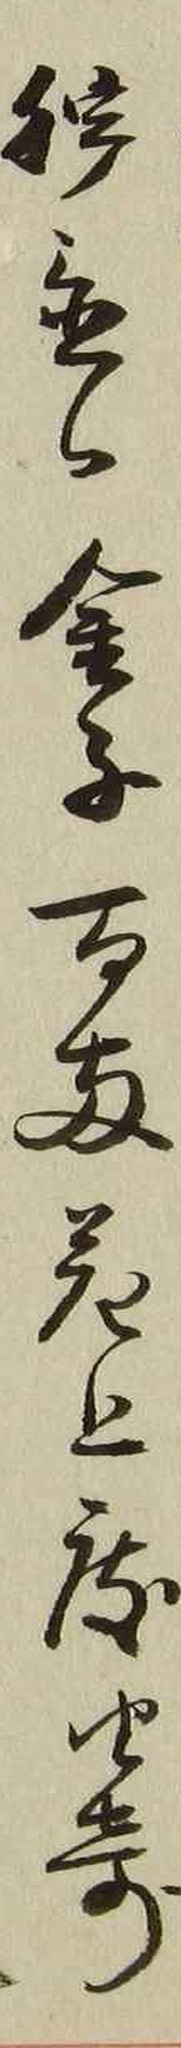貯置候金子百両差上度由奇
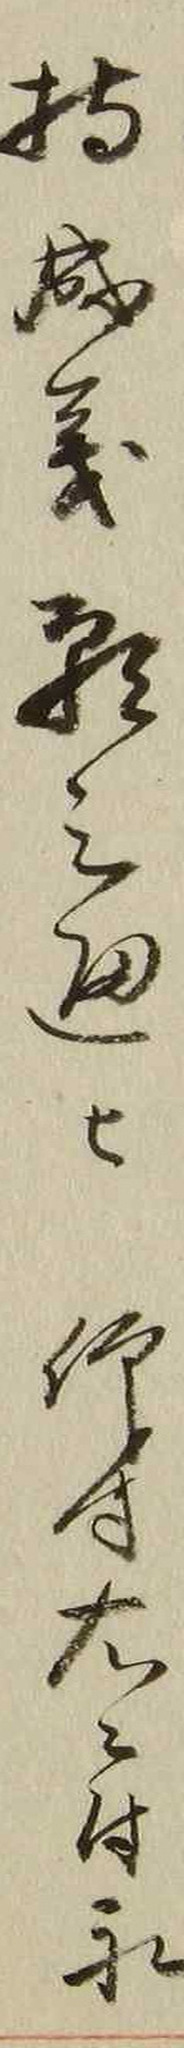特成義願之通被仰付右ニ付永
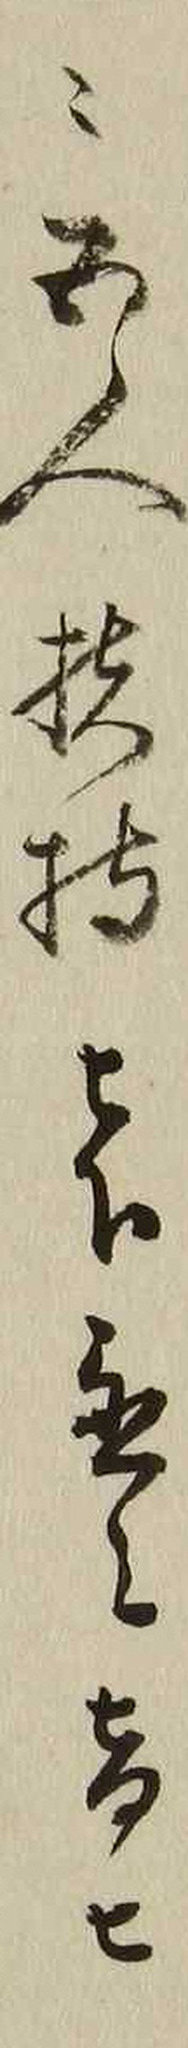々五人扶持被下置之旨被
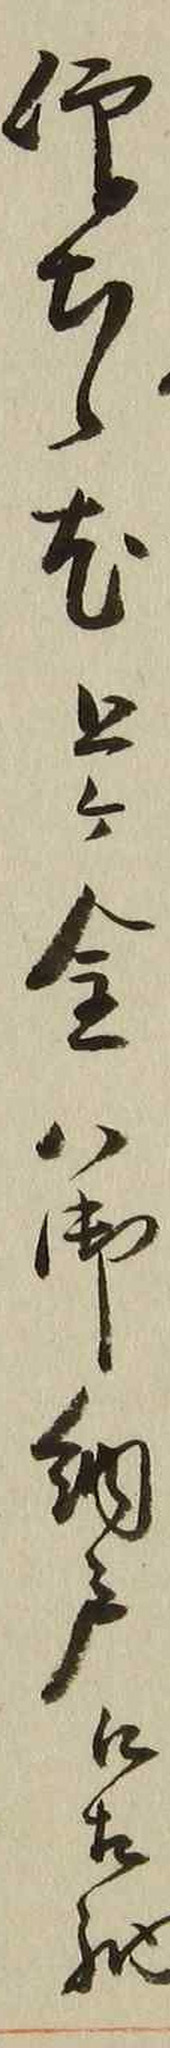仰出候尤上ヶ金ハ御納戸江相納
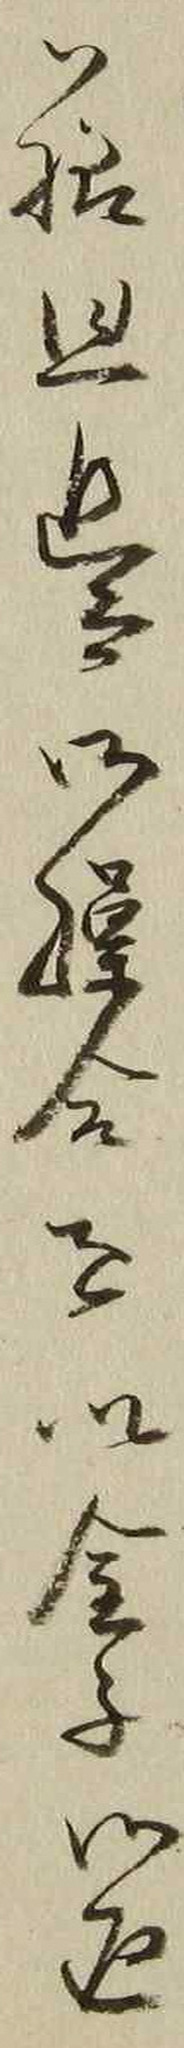候様且追而御操合を以金子御返
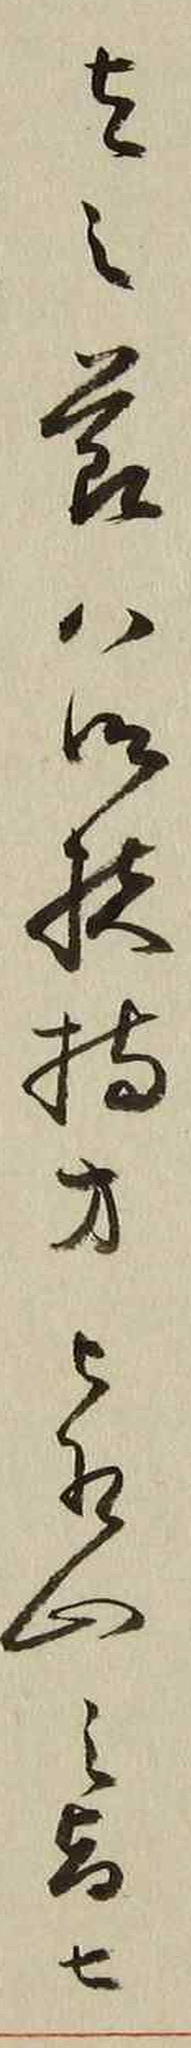と之節ハ御扶持方被相止之旨被
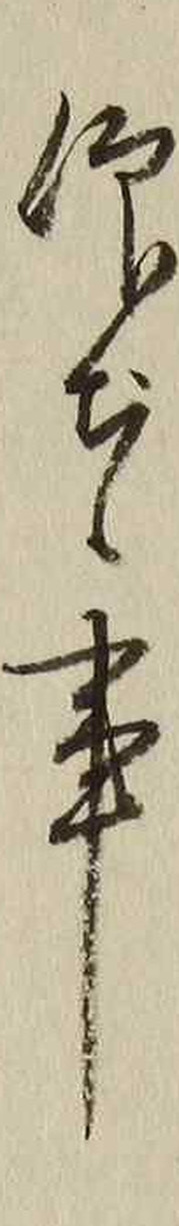仰出候事
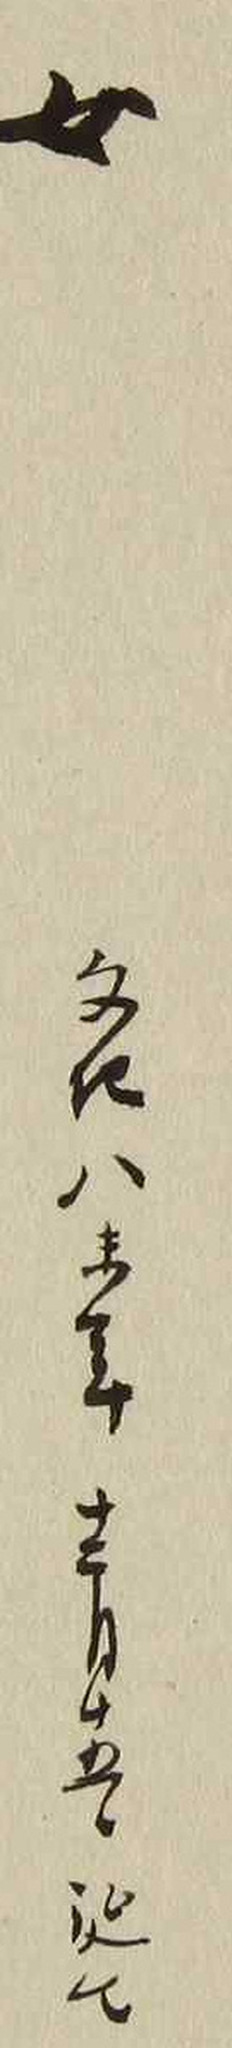女文化八未年十二月十五日誕生
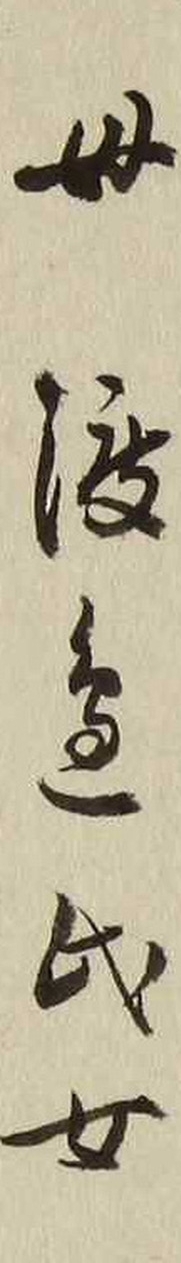母渡辺氏女

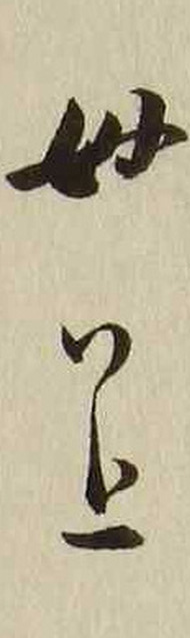母同上
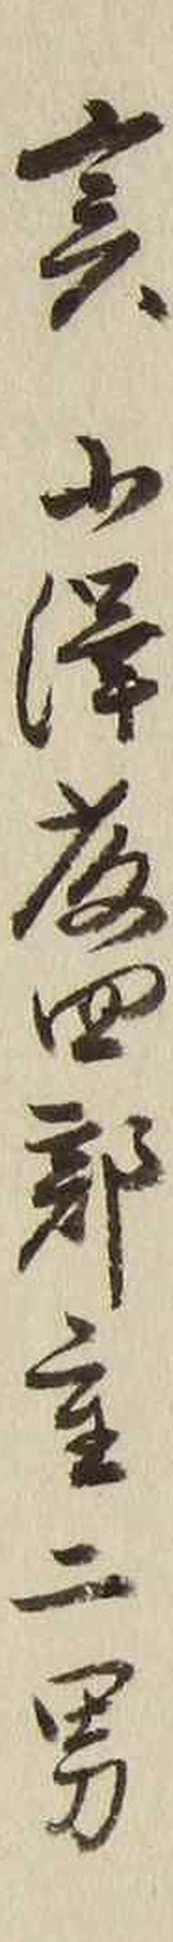実小沢藤四郎重二男
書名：諸士系譜　巻之288　さ之部20
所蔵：会津若松市立会津図書館
